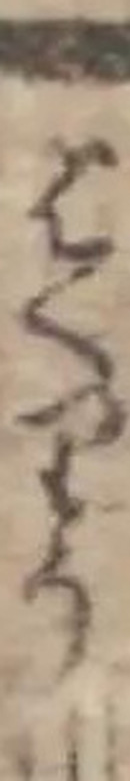はくりう
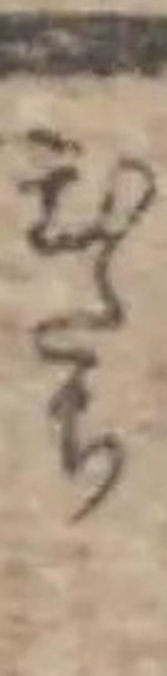ひたち
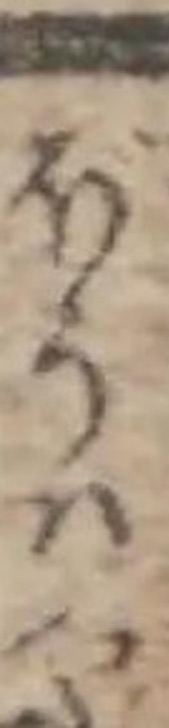ぼうハ
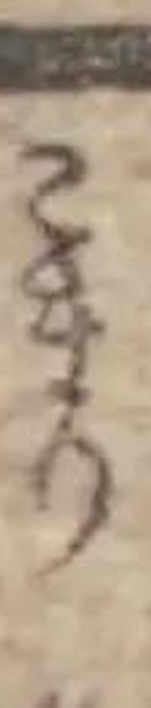こまり
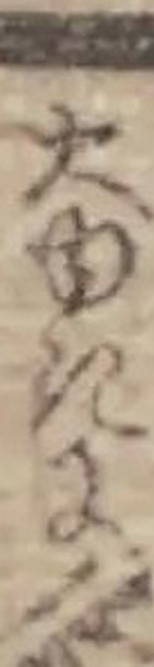大ゆきに
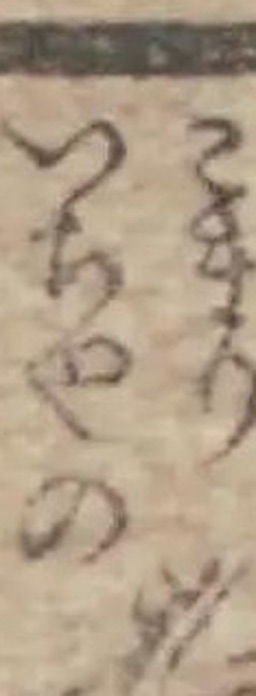いちやの
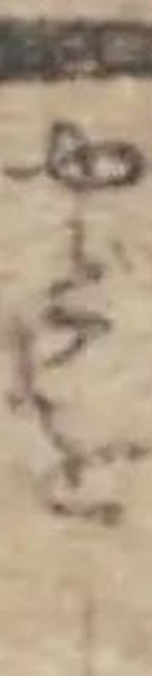やどを
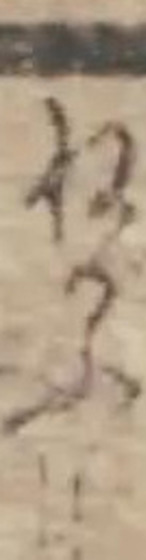ねがふ
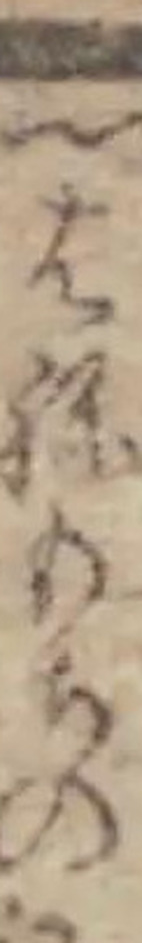「なねもちの
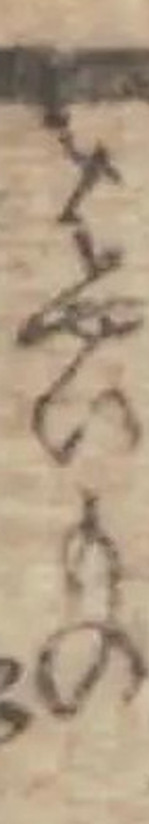はやいもの
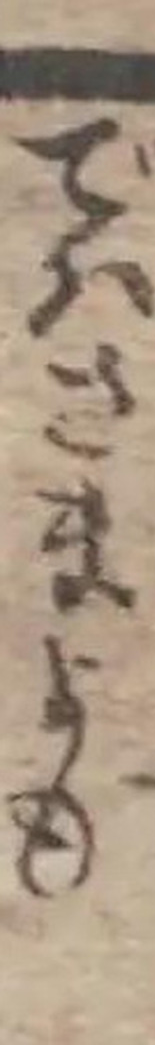でハさまよも
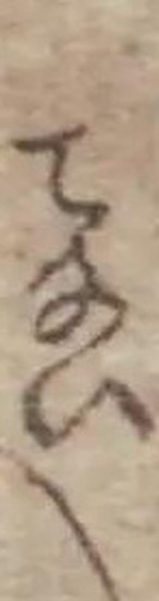てない
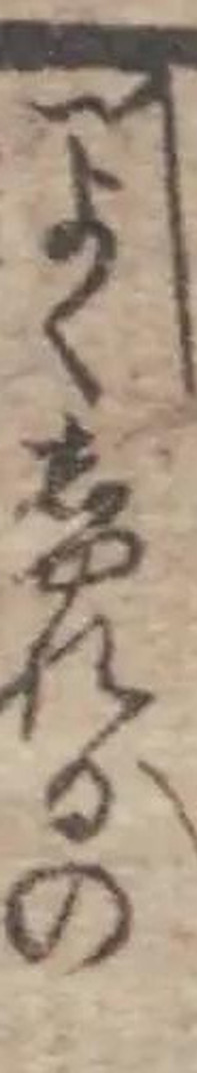「よくしやれるの
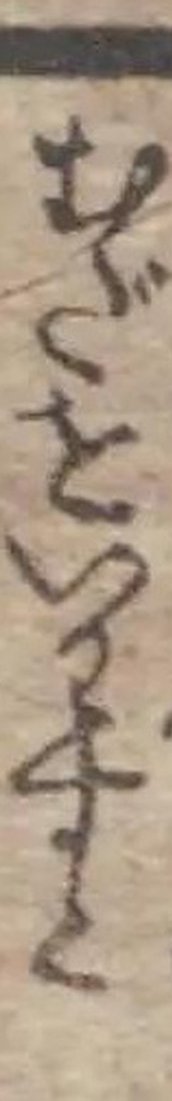むだをいわすと
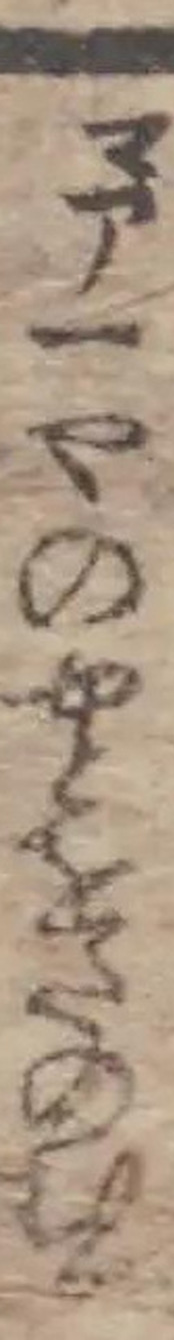マア一やのやとをたのむかいゝ

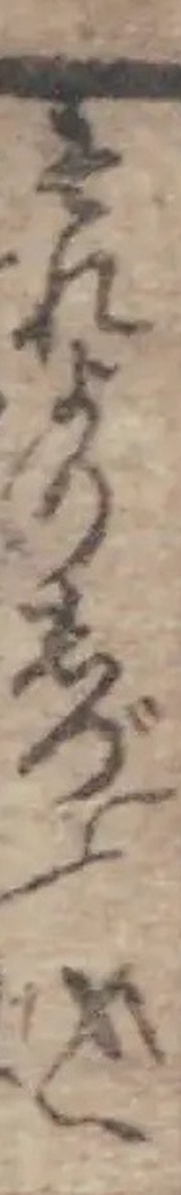それからしづ
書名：草紙の曙 3巻
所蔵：国立国会図書館 National Diet Library, JAPAN
